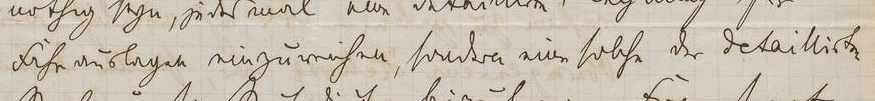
Fahrauslagen einzureichen, sondern eine solche der detaillirten
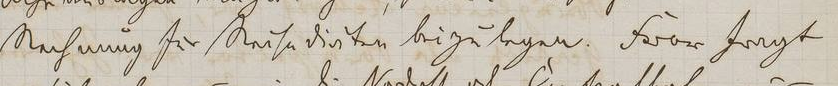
Rechnung für Reisediäten beizulegen. Ferner fragt
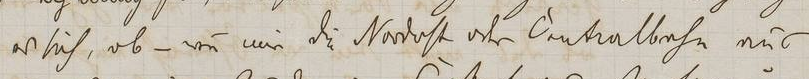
es sich, ob – wenn mir die Nordost oder Centralbahn aus
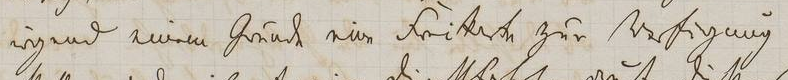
irgend einem Grunde eine Freikarte zur Verfügung
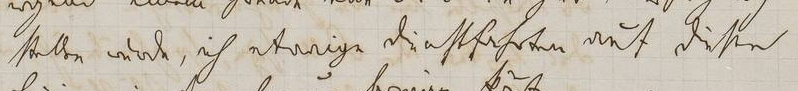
stellen würde, ich etwaige Dienstfahrten mit diesen
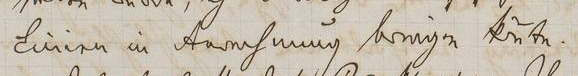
Linien in Anrechnung bringen könnte.
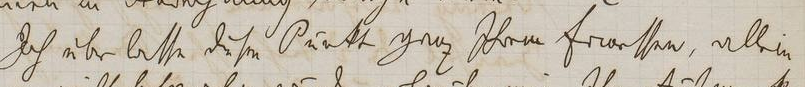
Ich überlasse diesen Punkt ganz Ihrem Ermessen, allein
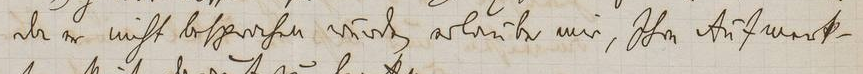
da er nicht besprochen wurde, erlaube mir, Ihre Aufmerk-
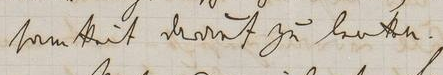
samkeit darauf zu lenken. –
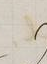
J.
